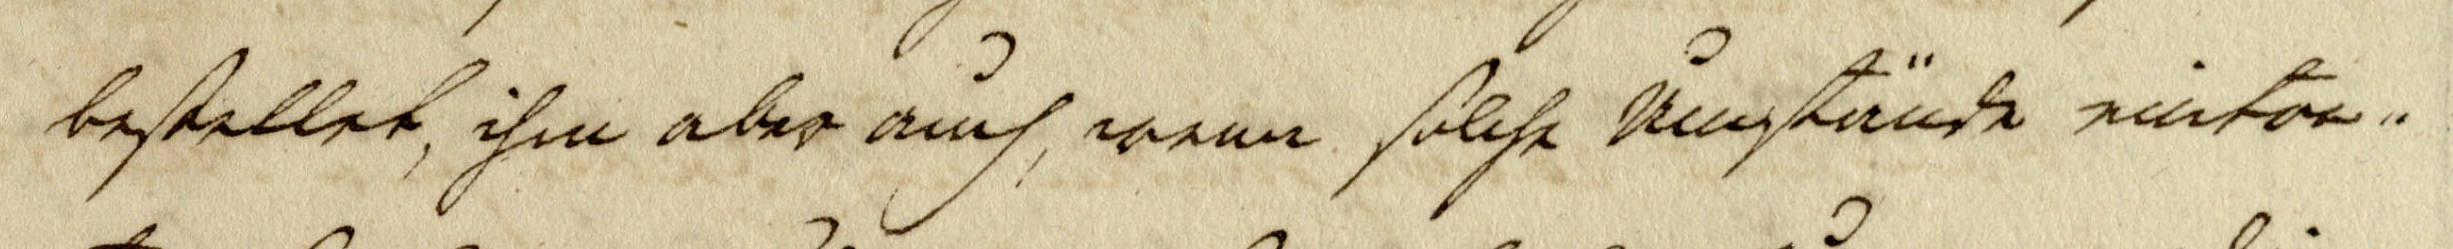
bestellet, ihm aber auch, wenn solche Umstände eintre¬
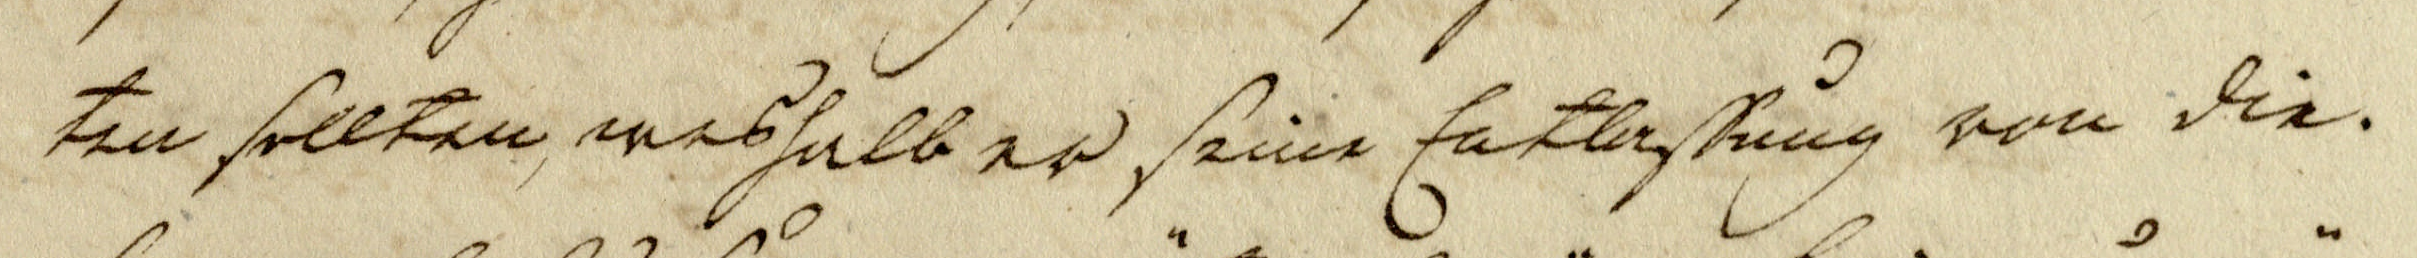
ten sollten, weshalb er seine Entlassung von die¬
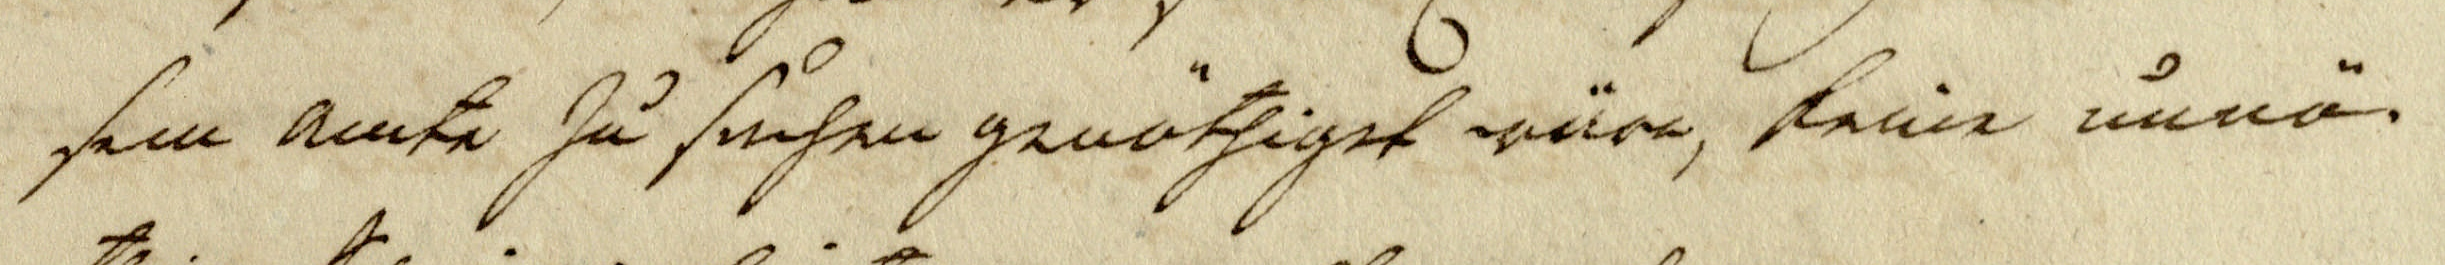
sem Amte zu suchen genöthiget wäre, keine unnö¬
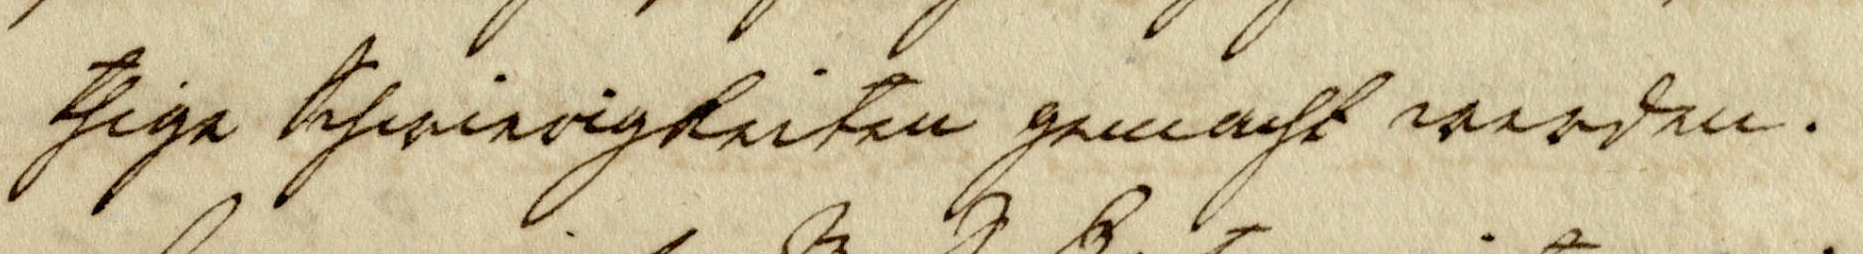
thige Schwierigkeiten gemacht werden.
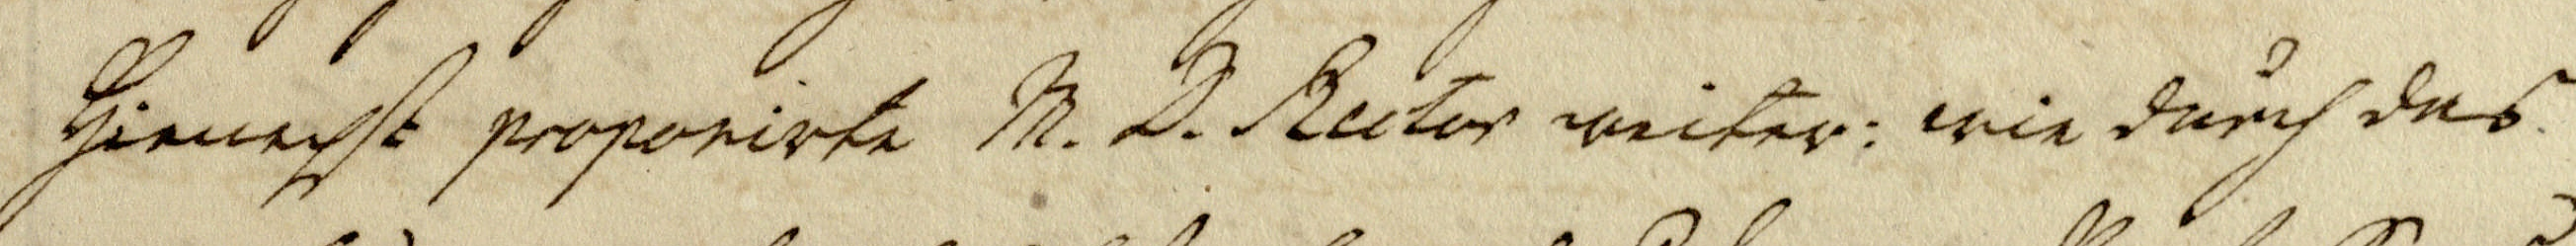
Hienechst proponirte M. D. Rector weiter: wie durch das
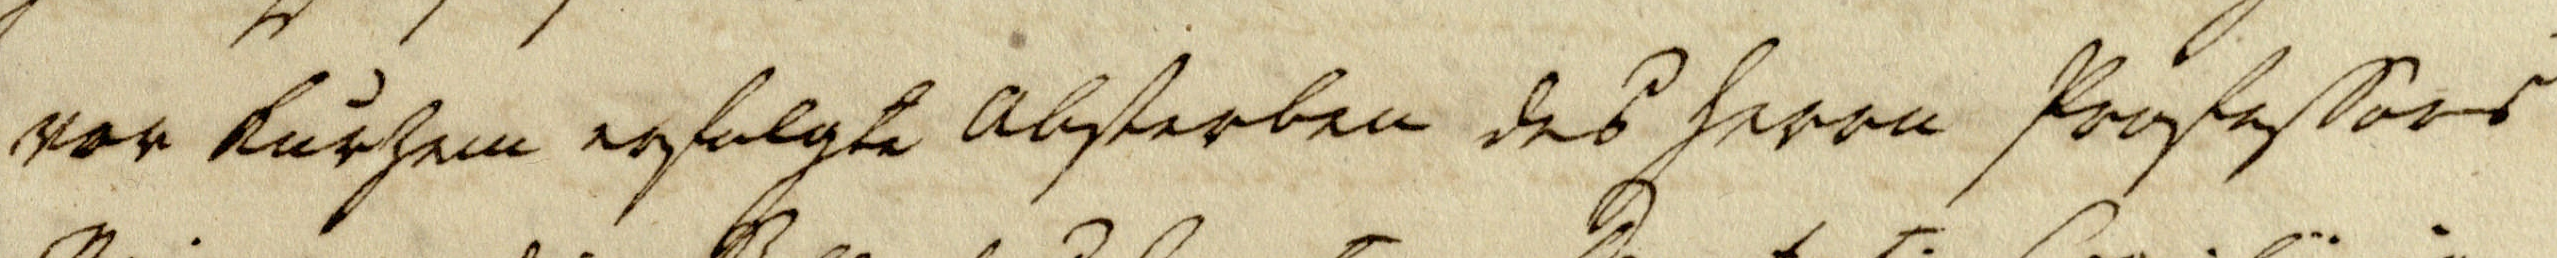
vor kurzem erfolgte Absterben des Herrn Professors
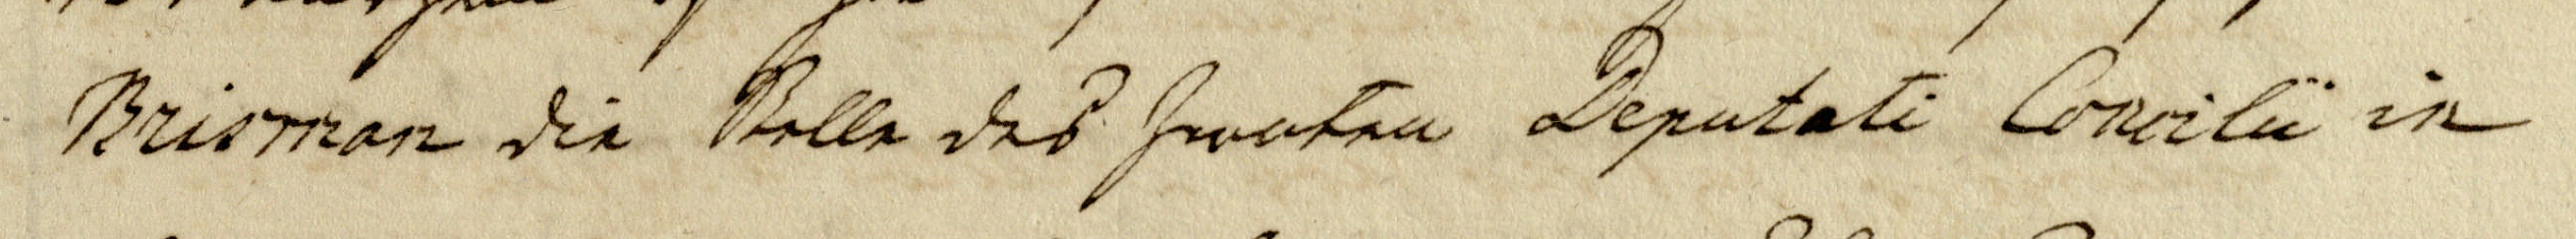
Brisman die Stelle des zwoten Deputati Concilii in
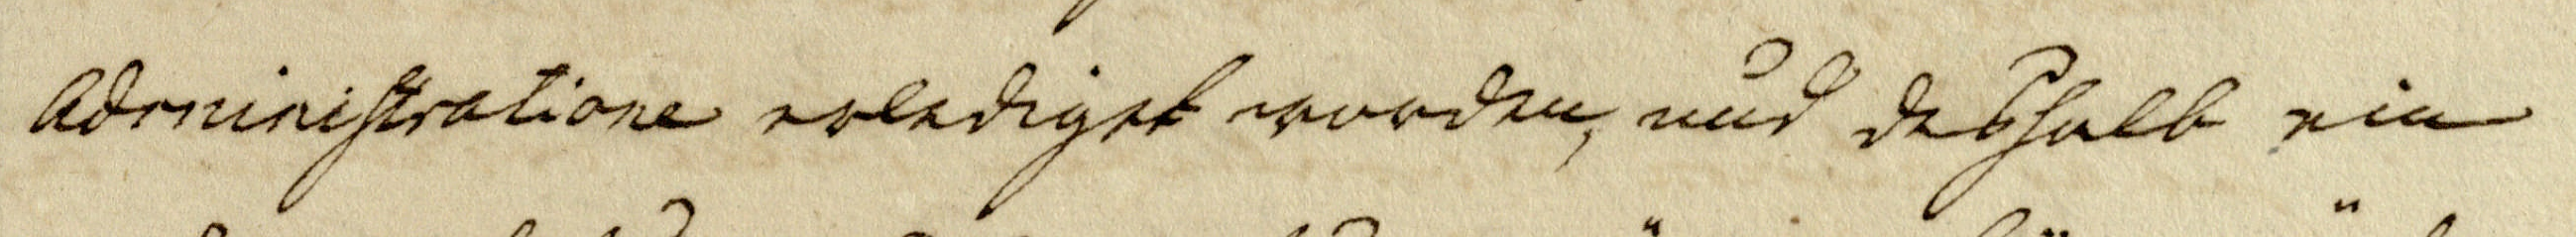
Administratione erlediget worden, und deshalb ein
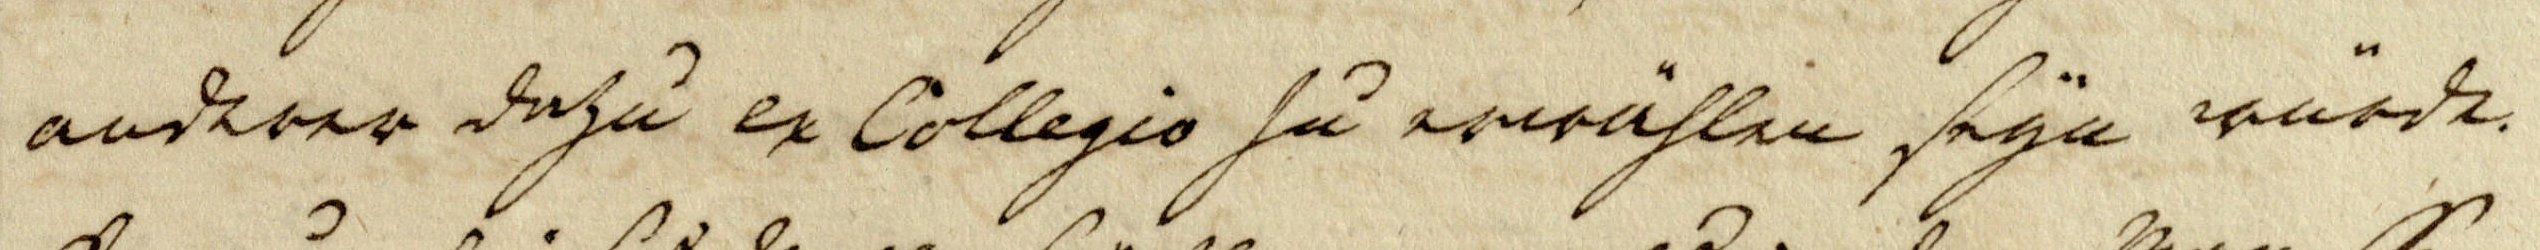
anderer dazu ex Collegio zu erwählen seÿn würde.
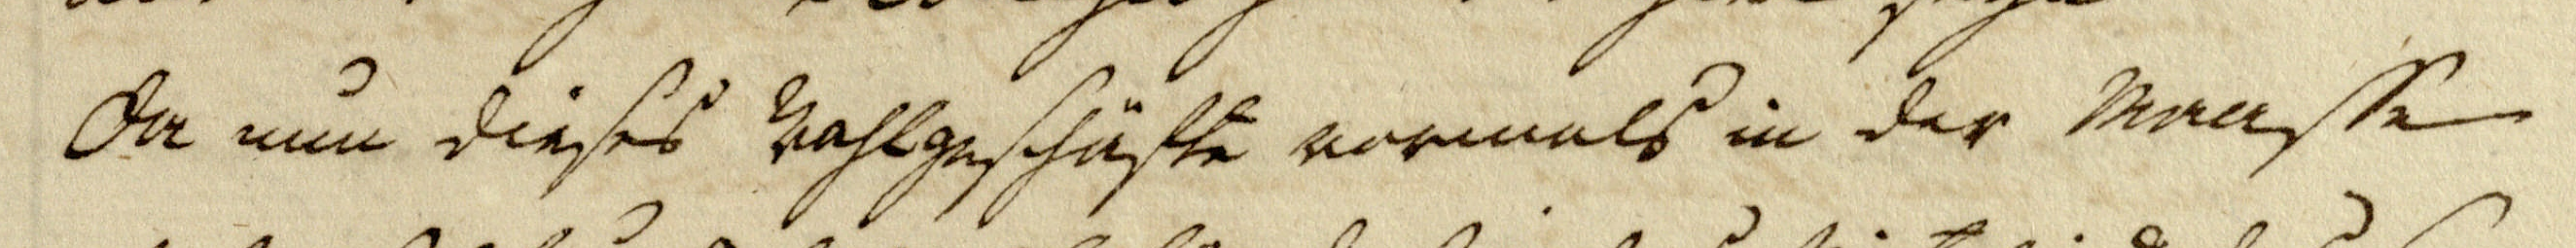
Da nun dieses Wahlgeschäfte vormals in der Maasse
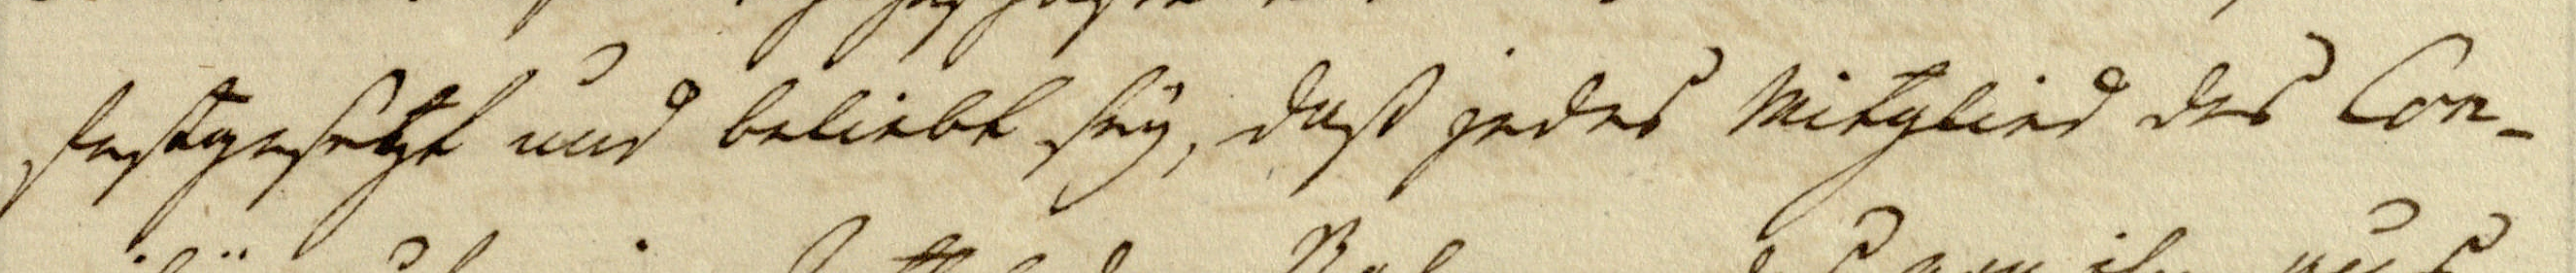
festgesetzt und beliebt seÿ, daß jedes Mitglied des Con¬
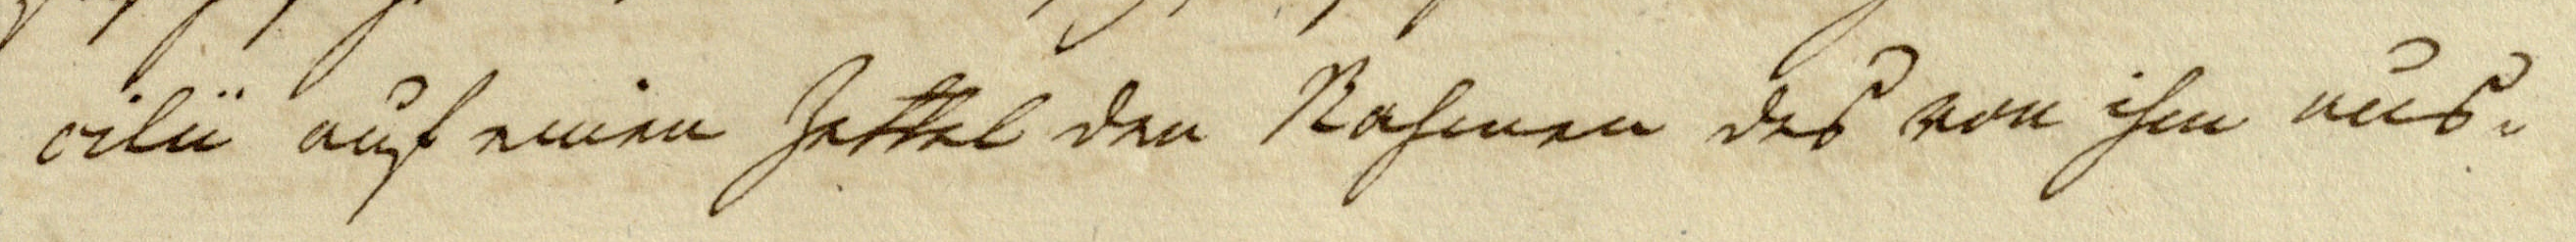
cilii auf einen Zettel den Nahmen des von ihm aus¬
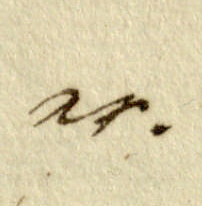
er¬
